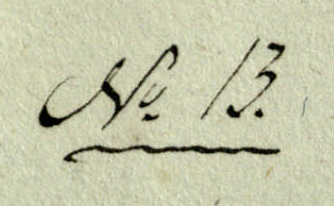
No 13.
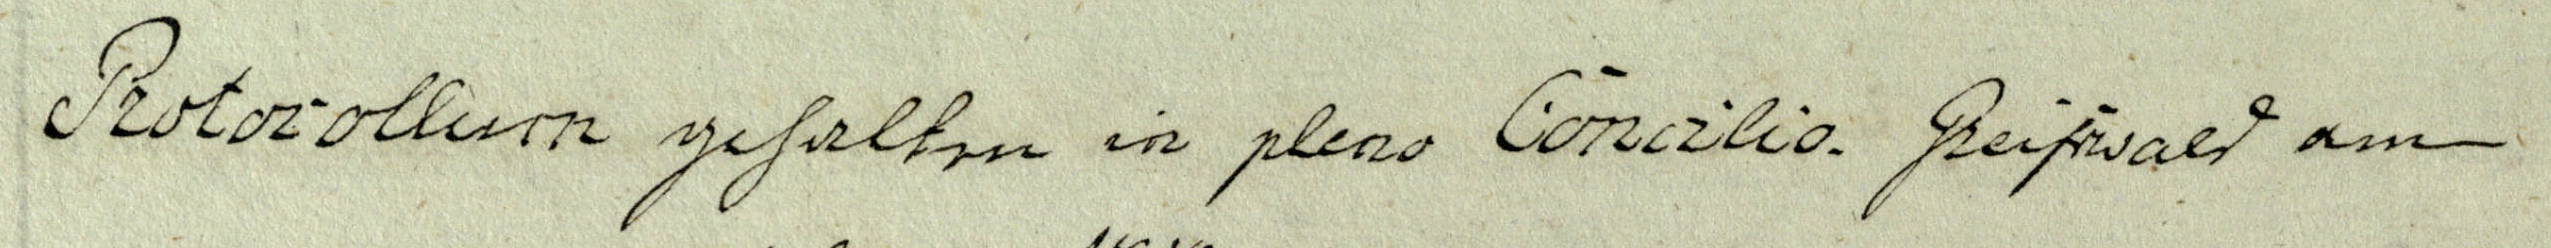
Protocollum gehalten in pleno Concilio. Greifswald am
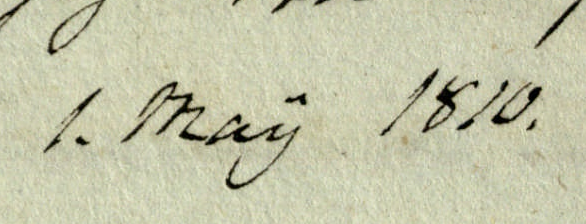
1. Maÿ 1810.
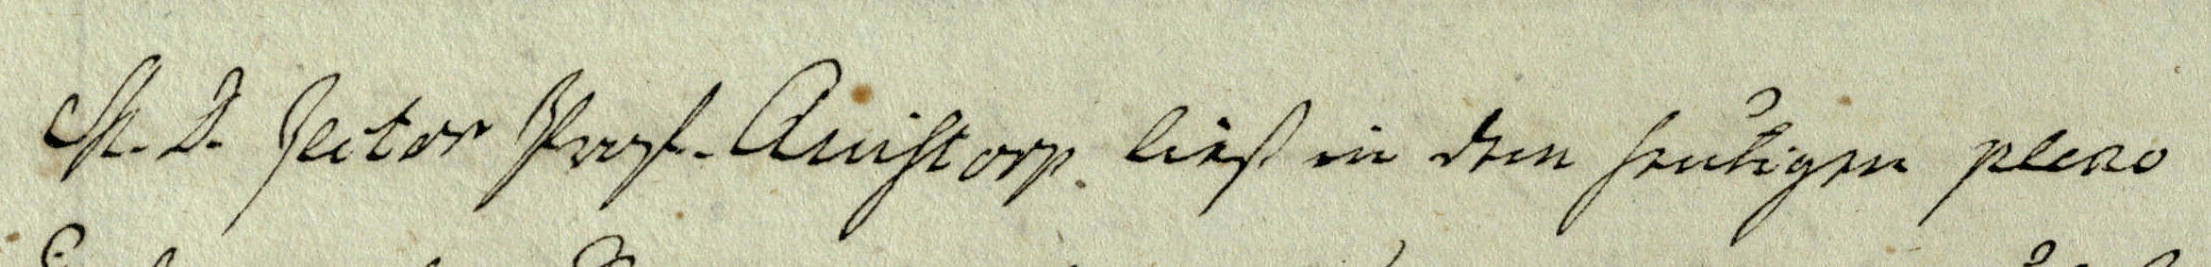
M. D. Rector Prof. Quistorp. ließ in dem heutigen pleno
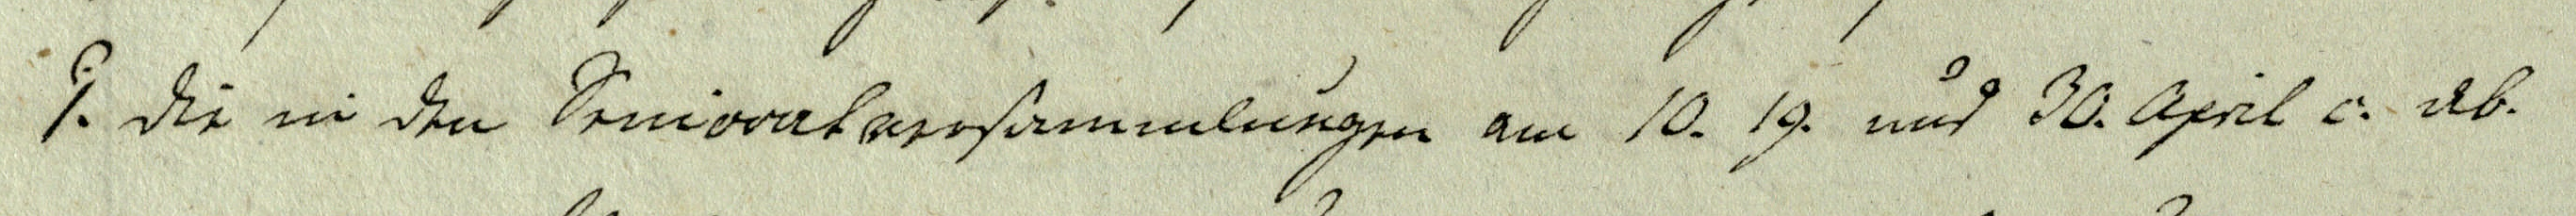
1. die in den Senioratsversammlungen am 10. 19. und 30. April c. ab¬
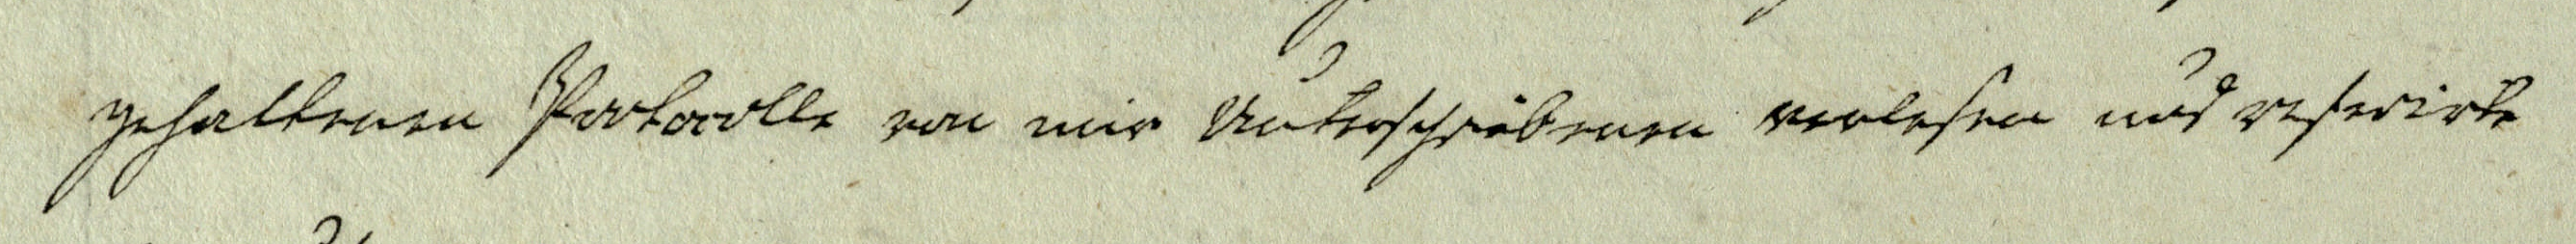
gehaltenen Protocolle von mir Unterschriebenen verlesen und referirte
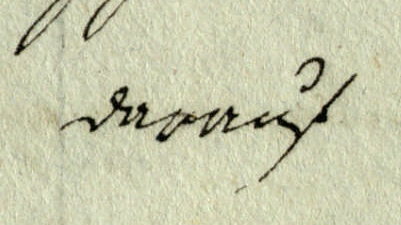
darauf
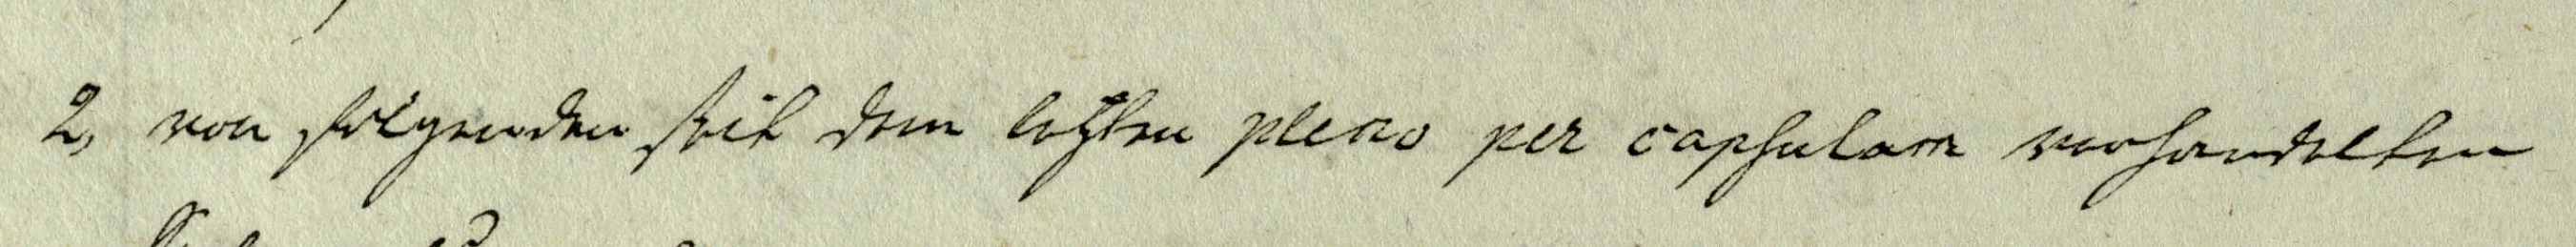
2, von folgenden seit dem letzten pleno per capsulam verhandelten
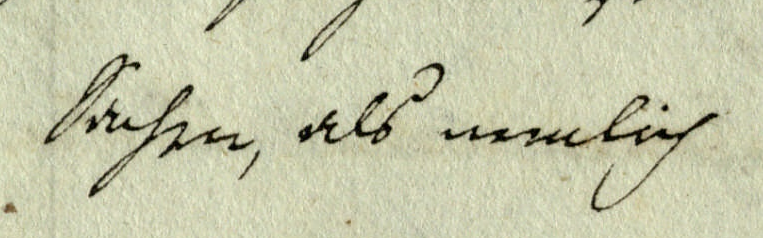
Sachen, als nemlich
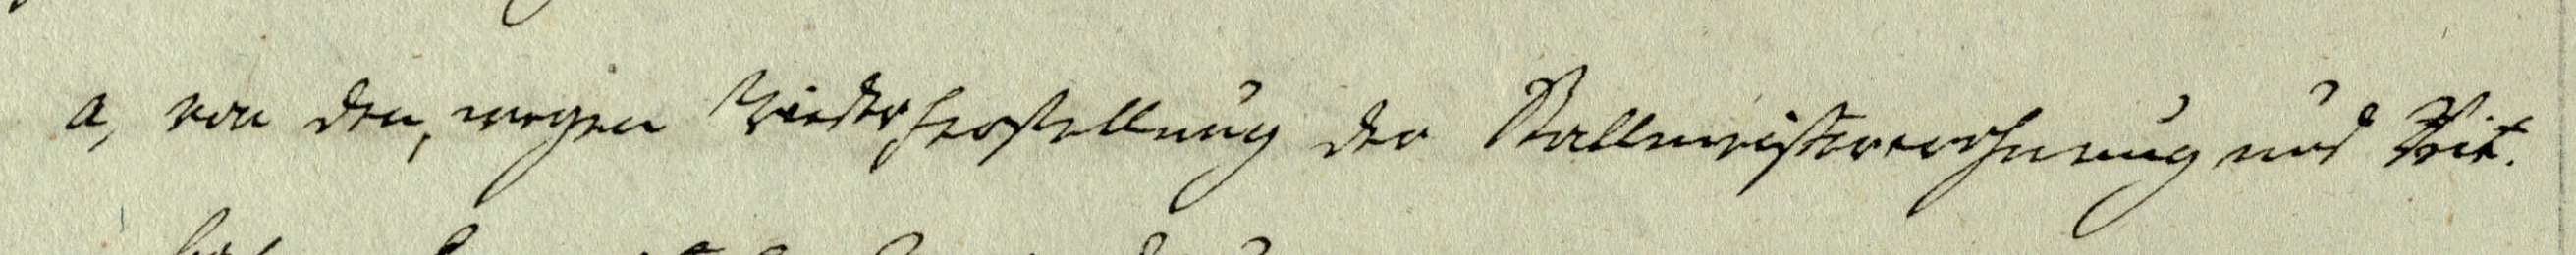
a, von den, wegen Wiederherstellung der Stallmeisterwohnung und Reit¬
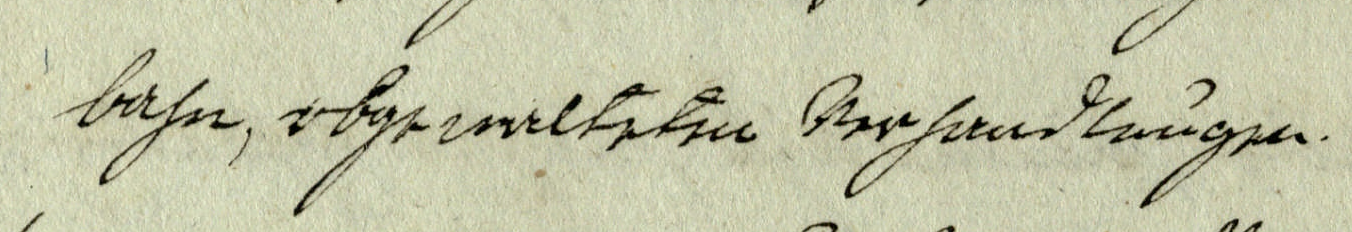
bahn, obgewalteten Verhandlungen.
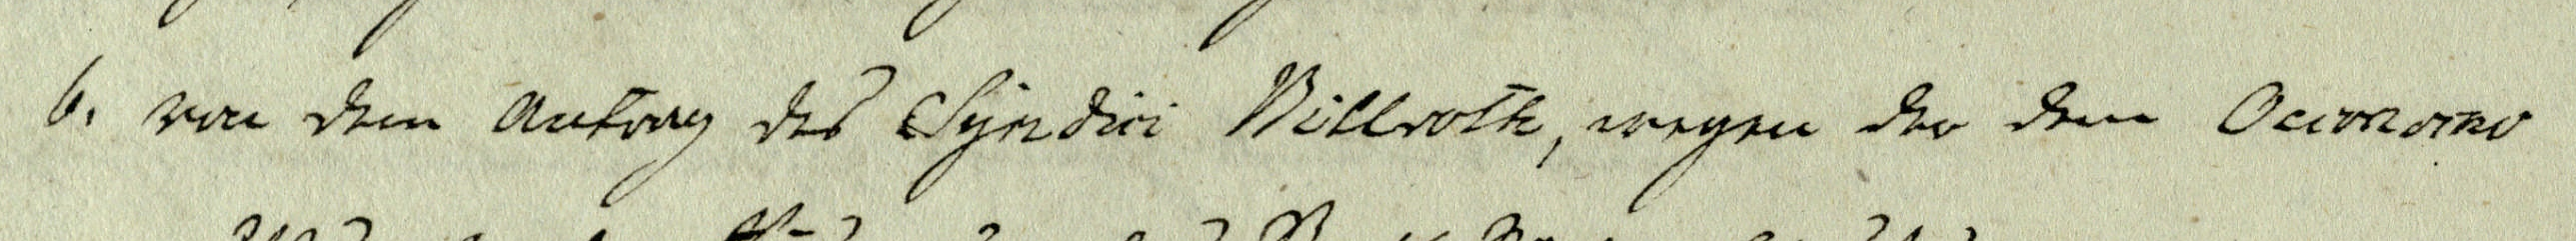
b. von dem Antrag des Sÿndici Billroth, wegen der dem Oeconomo
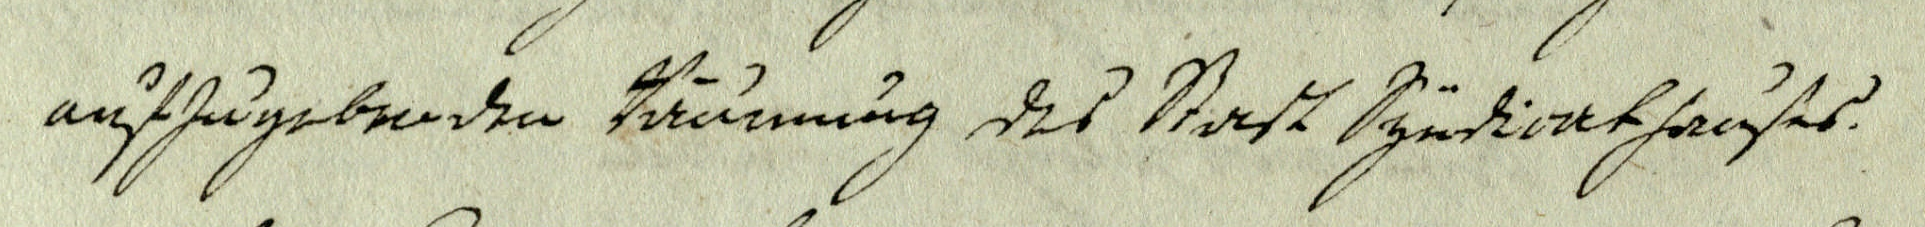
aufzugeben den Räumung des Stadt Sÿndicathauses.
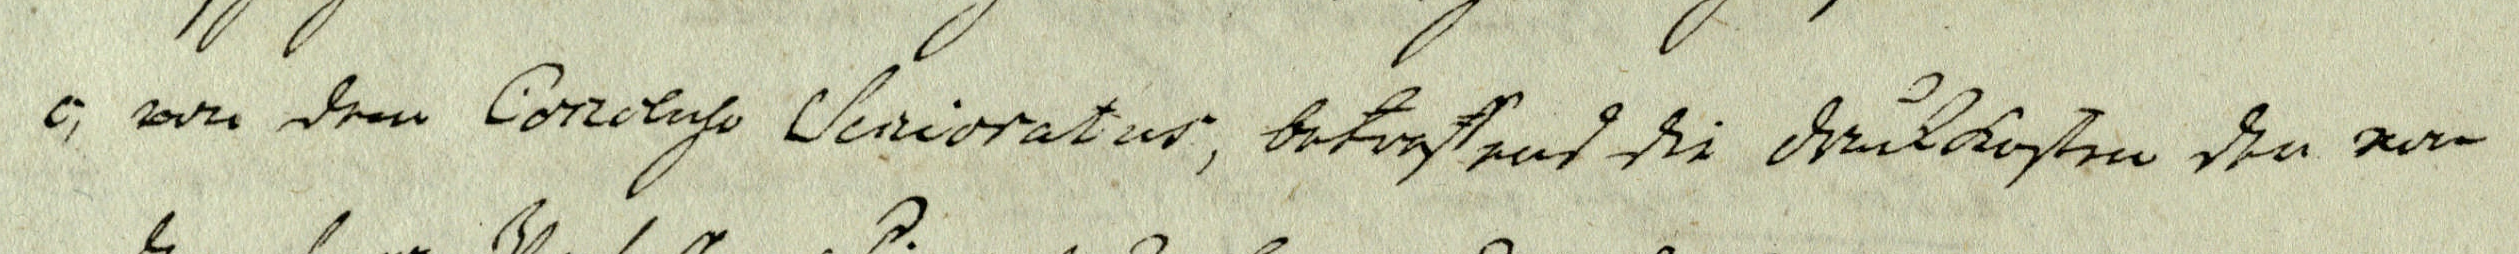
c, von dem Concluso Senioratus, betreffend die Druckkosten der von
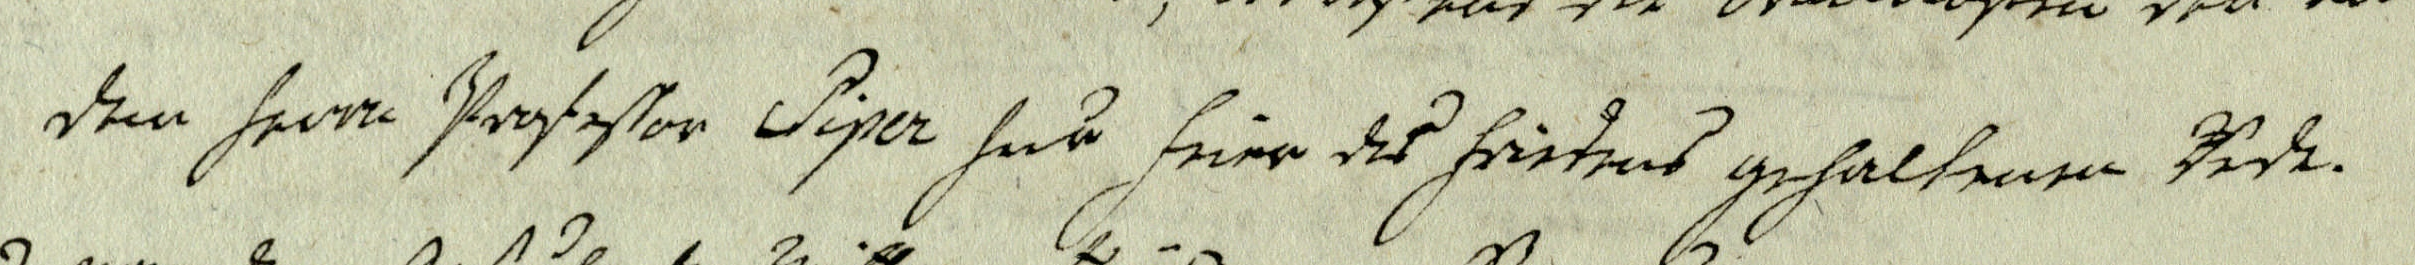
dem Herrn Professor Piper zur Feier des Friedens gehaltenen Rede.
